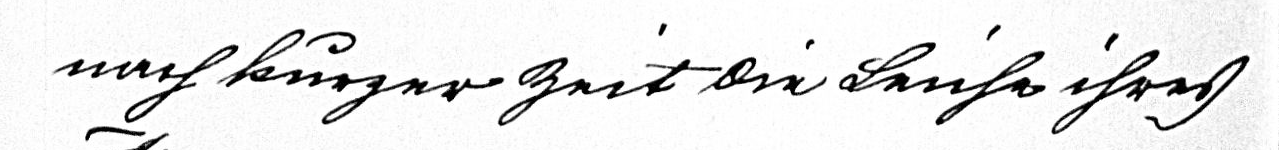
nach kurzer Zeit die Leiche ihres
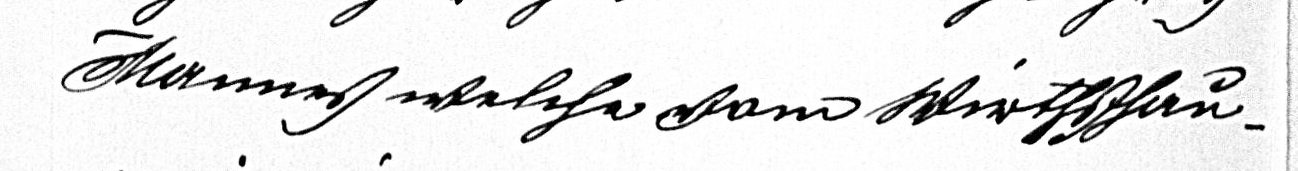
Mannes welche vom Wirthshau¬
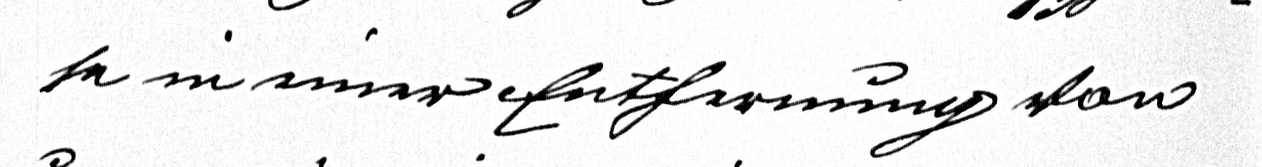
se in einer Entfernung von
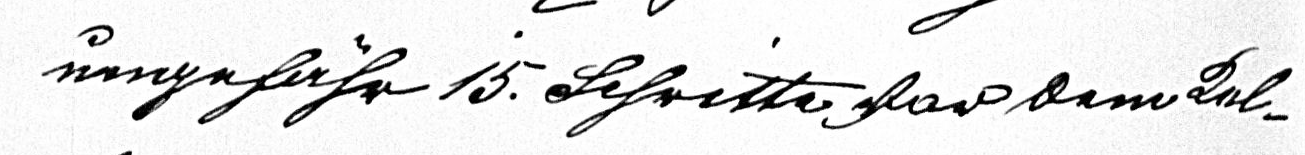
ungefähr 15. Schritte vor dem Kel¬
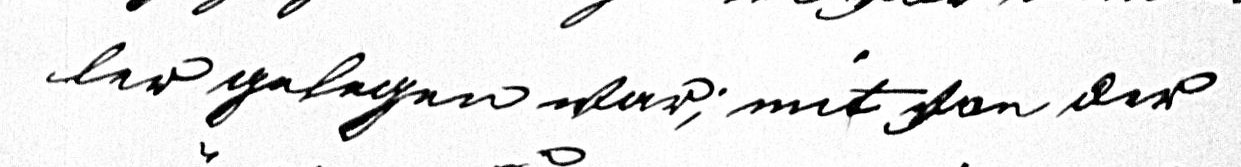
ler gelegen war; mit von der
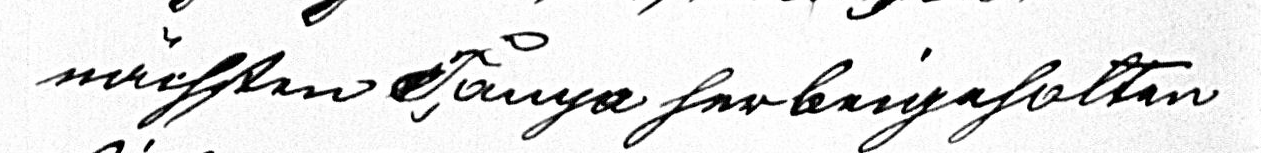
nächsten Tanya her beigeholten
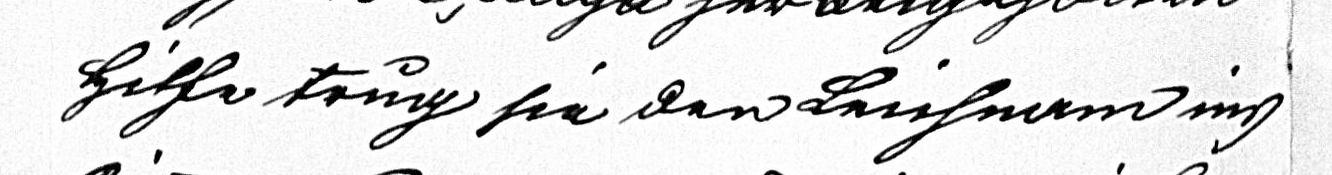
Hilfe trug sie den Leichnam ins
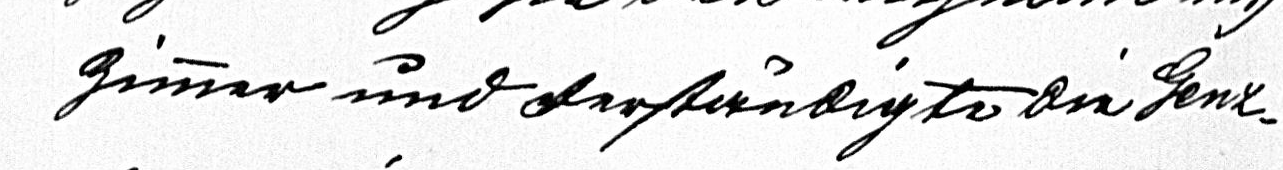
Zimmer und verständigte die Genz¬
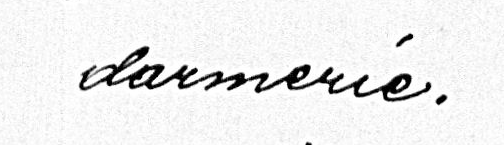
darmercé.
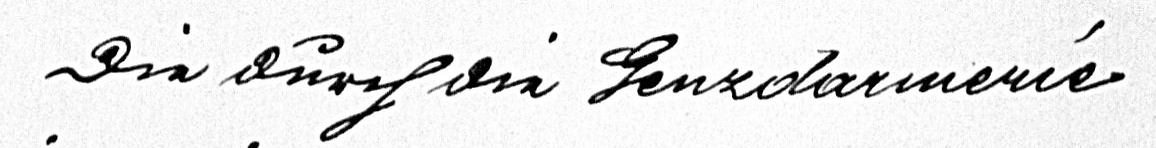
Die durch die Genzdarmercé
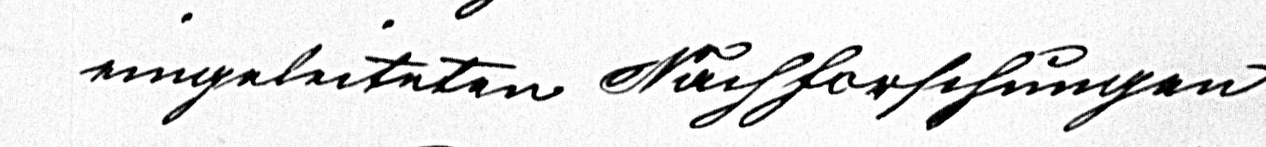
eingeleiteten Nachforschungen
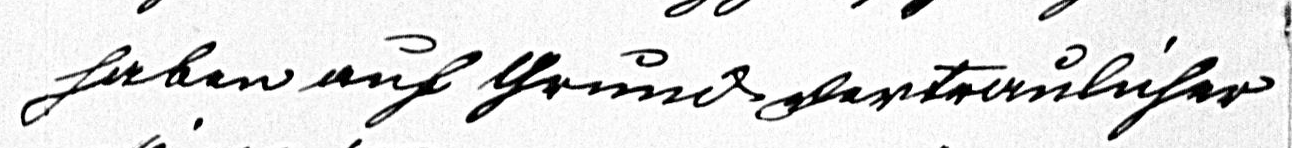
haben auf Grund vertraulicher
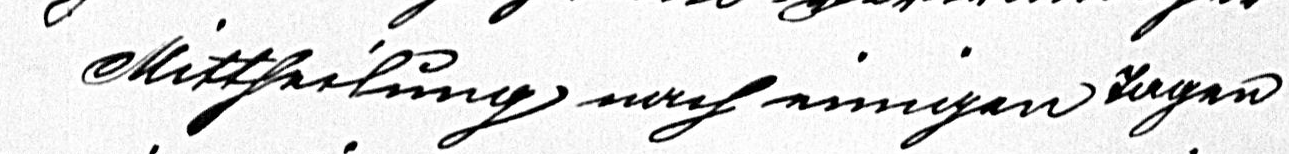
Mittheilung nach einigen Tagen
